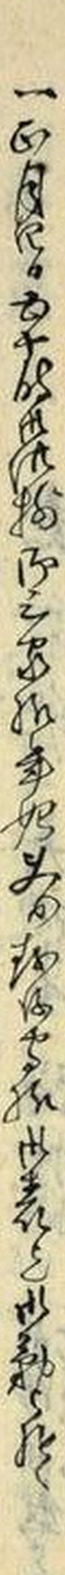一正月四日五半時御供揃御三家様年始夫ゟ越後守様御表迄御勤被遊候
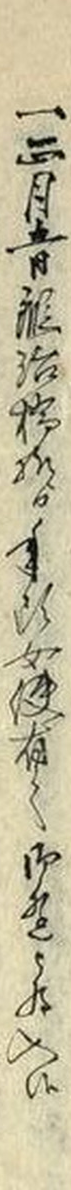一正月五日鍛冶橋様ゟ年頭女使有之御逢被為入候
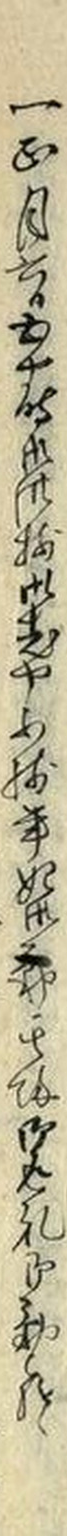一正月六日五半時御供揃御老中不残年始御勤其餘御返礼御勤被遊候
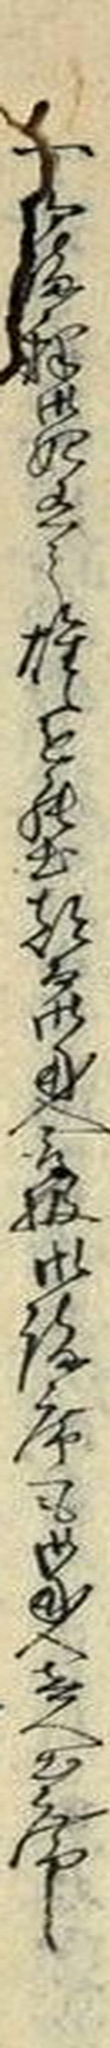一御講釈御始有之雄之進罷出都而御用人取扱御講席へも御用人壱人出席
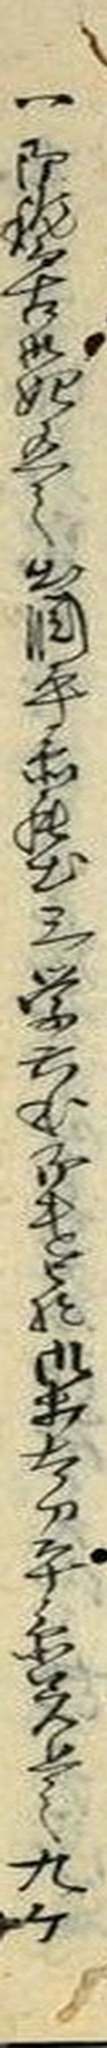一御稽古御始有之出淵平兵衛罷出三学六本御遣被遊御相太刀平兵衛差上之九ヶ
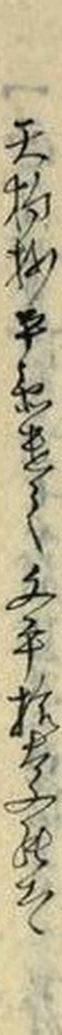天狗抄平兵衛遣之文平権太夫罷出候

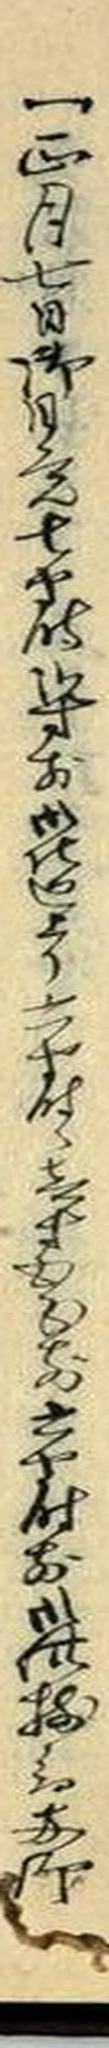一正月七日御目覚七半時弐寸前御仕廻上り六半時へ壱寸五分前六半時前御供揃ニ而両御
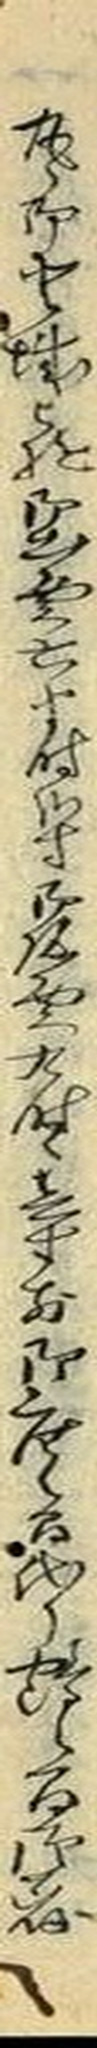丸へ御登城被遊御出殿六半時弐寸御帰殿九時へ壱寸前御座之間代り鶴之間御着
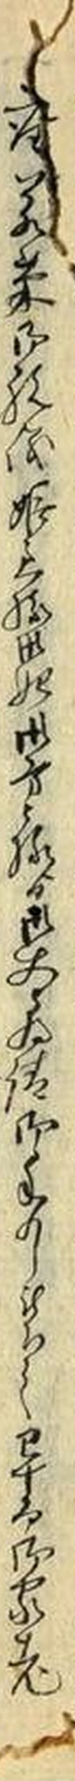座若菜御祝儀姫君様御始御方々様ゟ御使被為請御手のし被下之畢而御家老
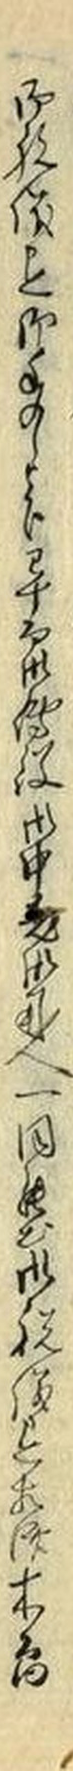御祝儀申上御手のし被下畢而御傅役御中老御用人一同罷出御祝儀申上相済木曽
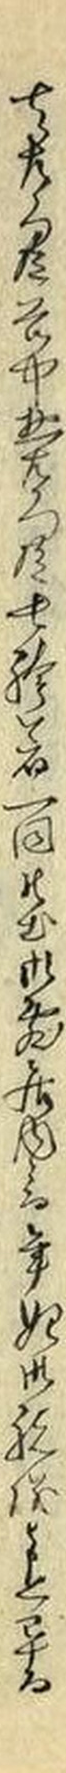七郎右衛門殿谷中惣左衛門殿長絝着一同被出御敷居内ニ而年始御祝儀被申上畢而
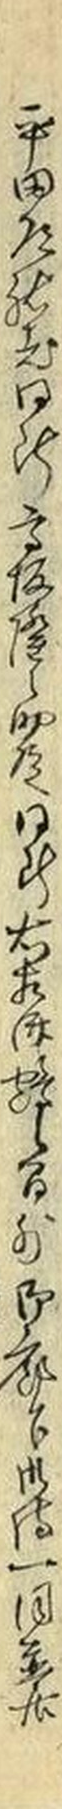平田道祐老同断高坂隆之助殿同断右相済鶴之間外御廊下御侍一同並居
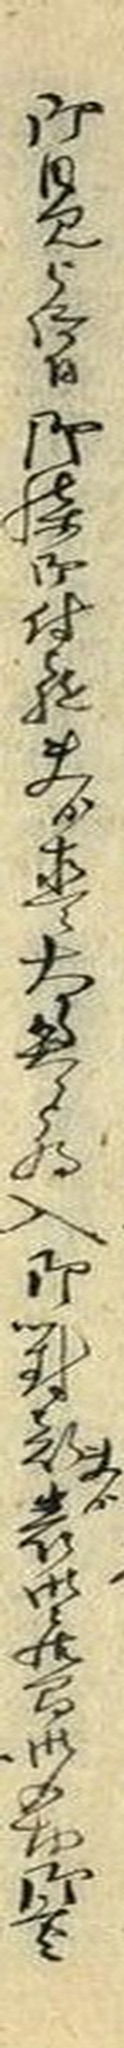御目見被仰付御膝御付被遊夫ゟ直ニ大奥被為入御対顔夫ゟ表御居間御〆切御方々
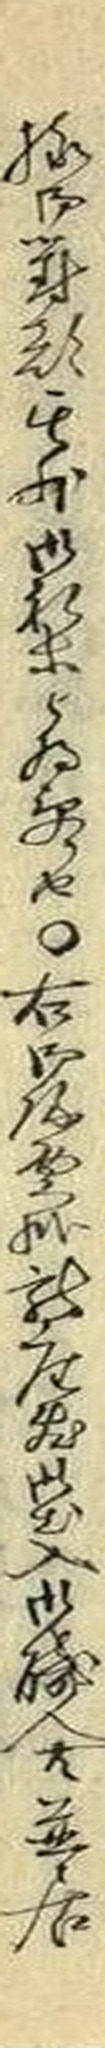様御対顔其外御礼等被受候由○右御帰殿掛新座敷御出入職人共並居
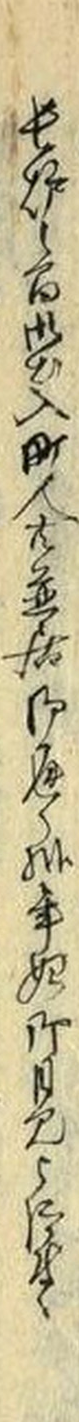長炉之間御出入町人共並居御通り掛年始御目見被仰付候
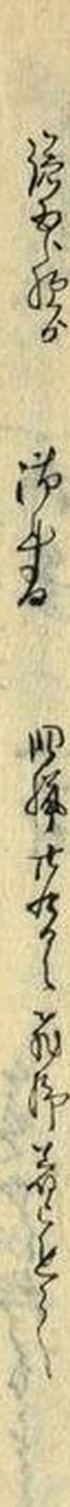謙五郎様ゟ御書旧臘廿九日之飛脚着被進之
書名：少傅日録抄（斉承付側向頭取日記、在府）
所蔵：福井県文書館 Fukui Prefectural Archives
